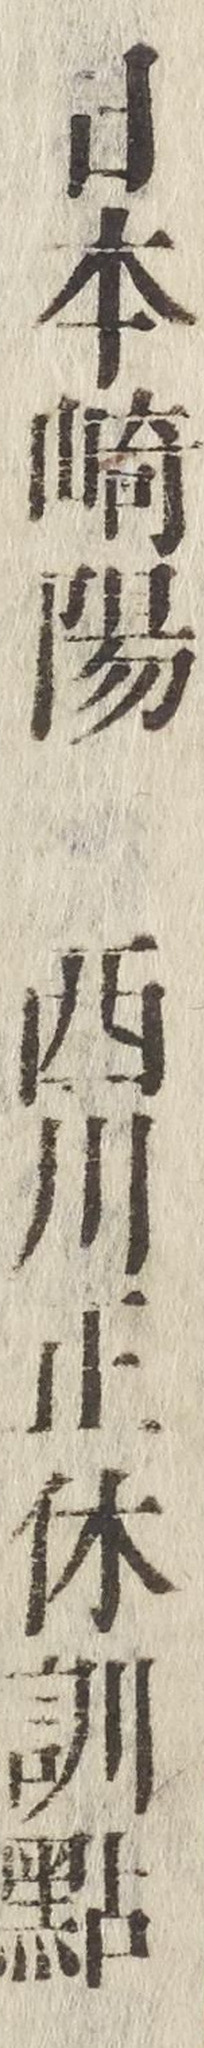日本崎陽西川正休訓点
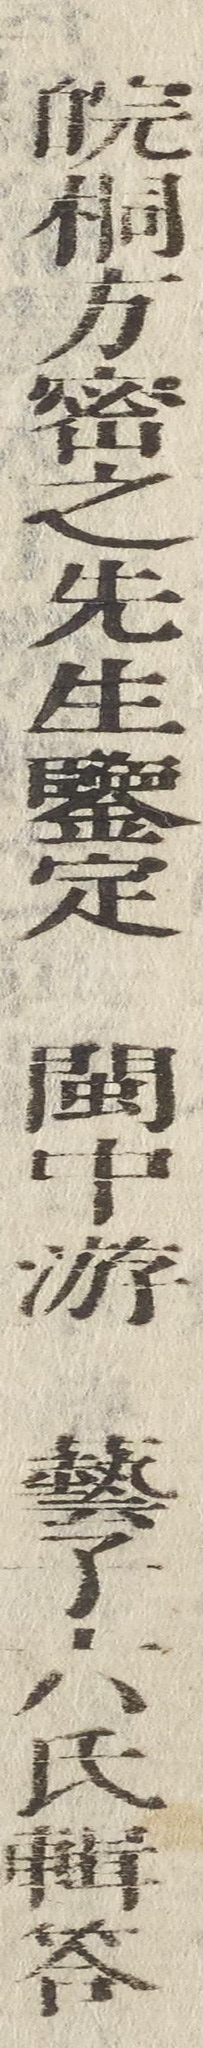皖桐方密之先生鑒定閩中游芸子六輯答
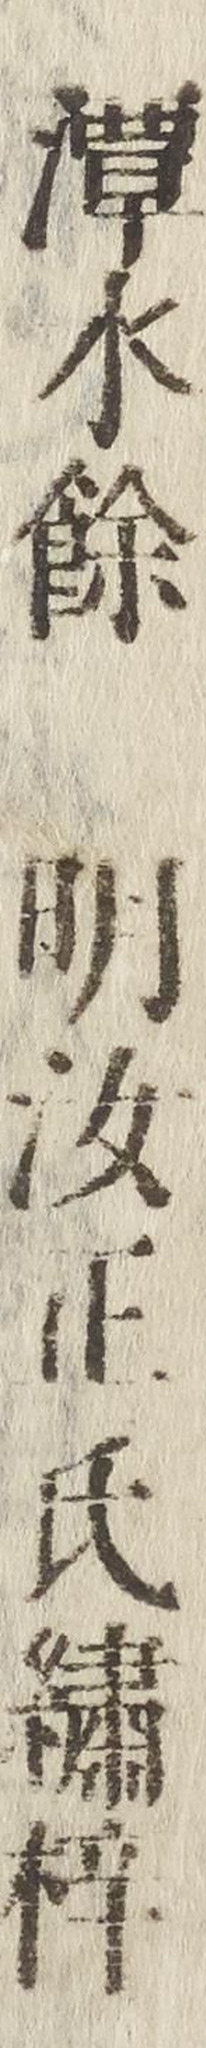潭水余明汝正氏繍梓

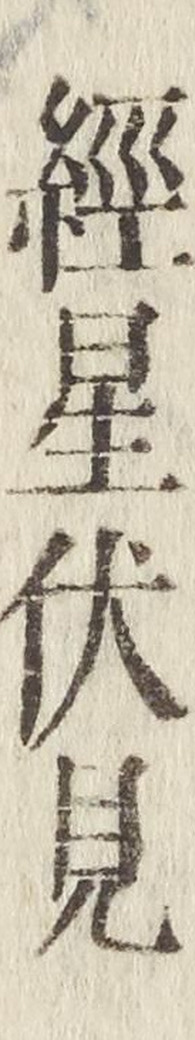経星伏見
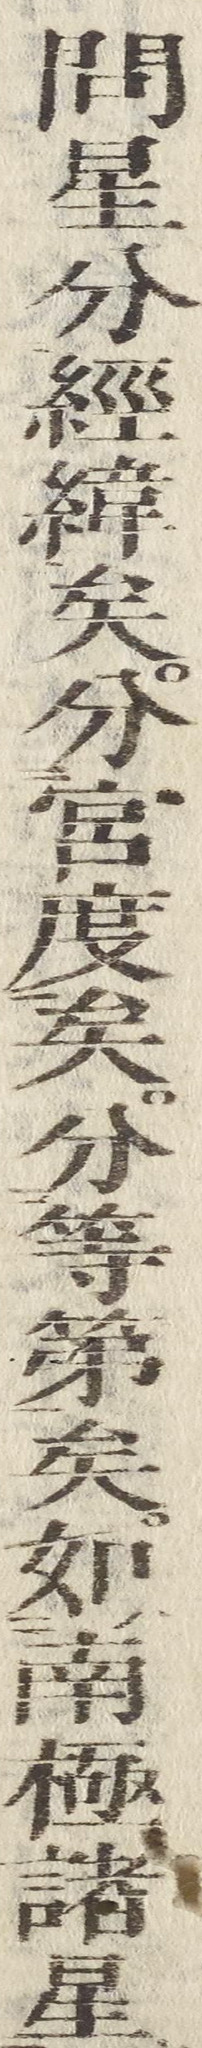問星分経緯矣。分宮度矣。分等第矣。如南極諸星。
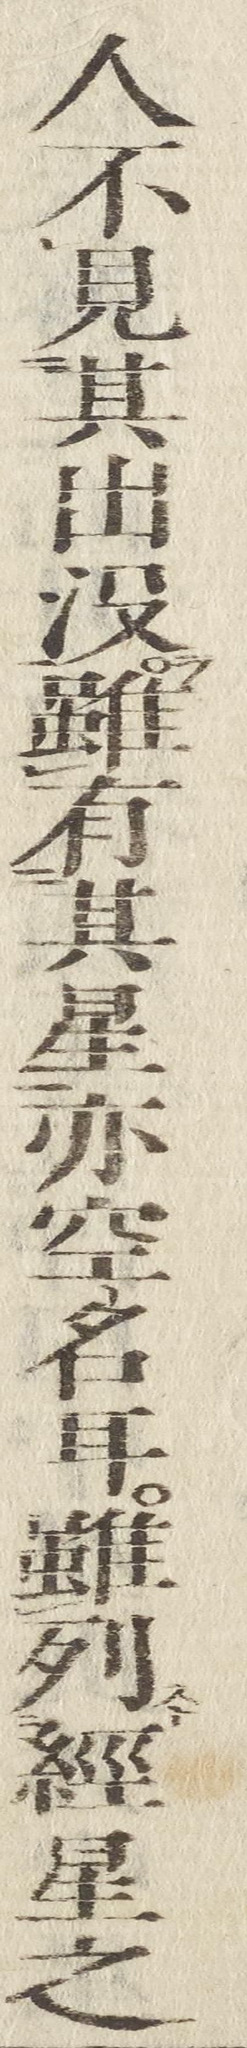人不見其出没雖有其星亦空ー名耳。雖列経星之

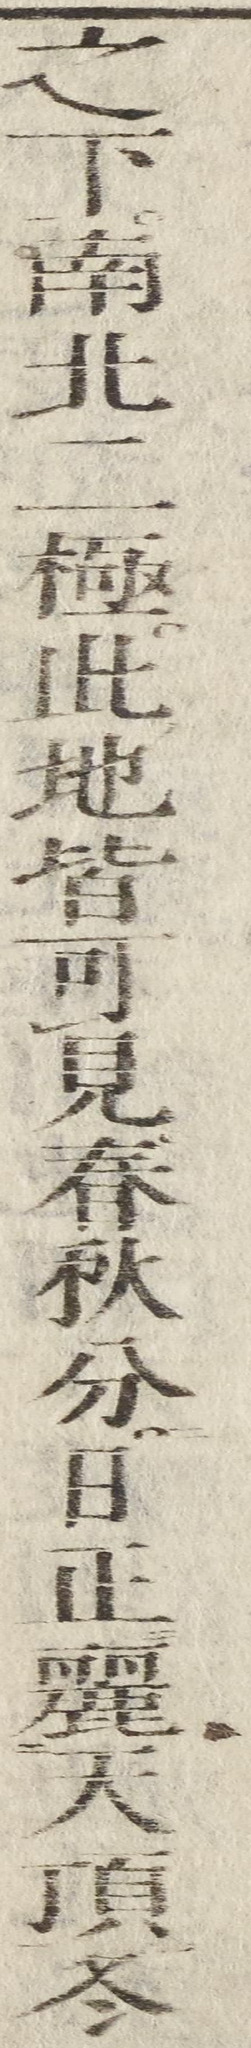之下。南北二極。此地皆可見。春秋分。日正麗天頂。冬
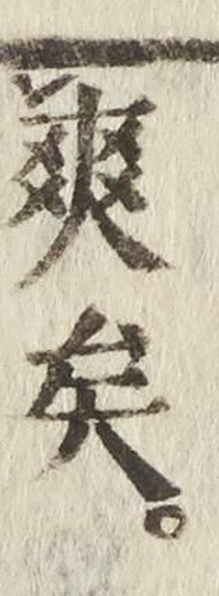爽矣。
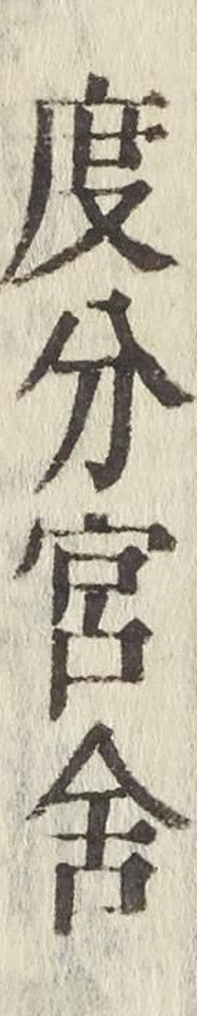度分宮舎
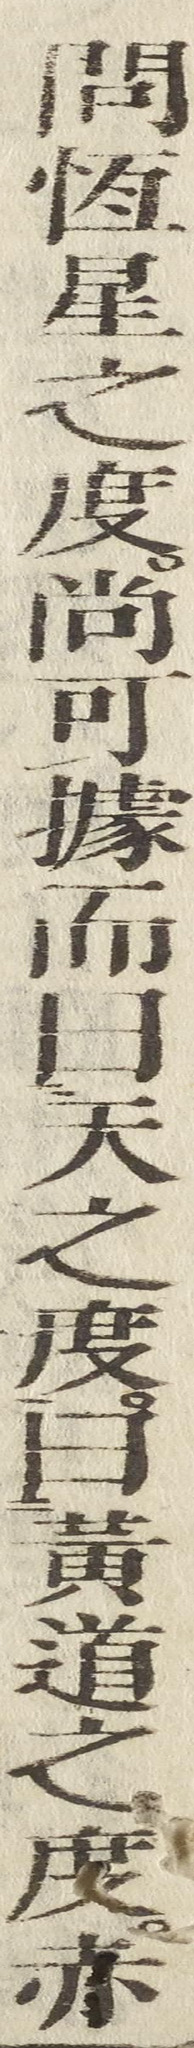問恒星之度。尚可拠而曰天之度。曰黄道之度。赤

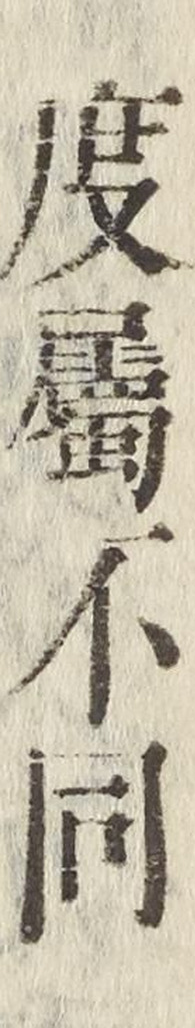度属不同
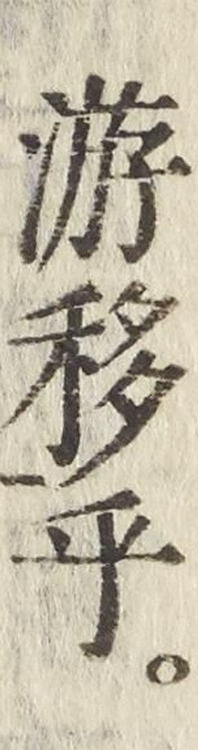游移乎。
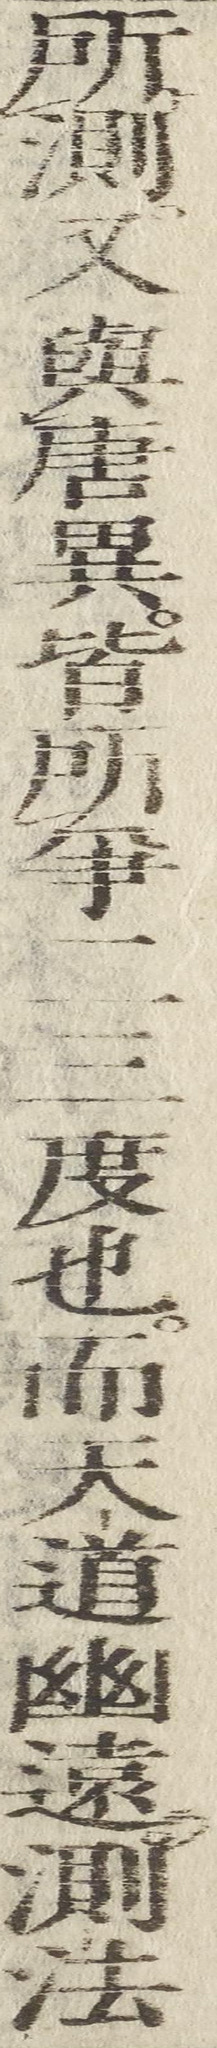所測。又与唐異。皆所争二三度也。而天－道幽遠測法

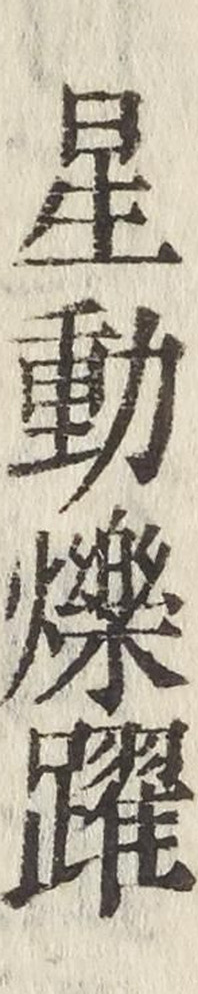星動爍躍
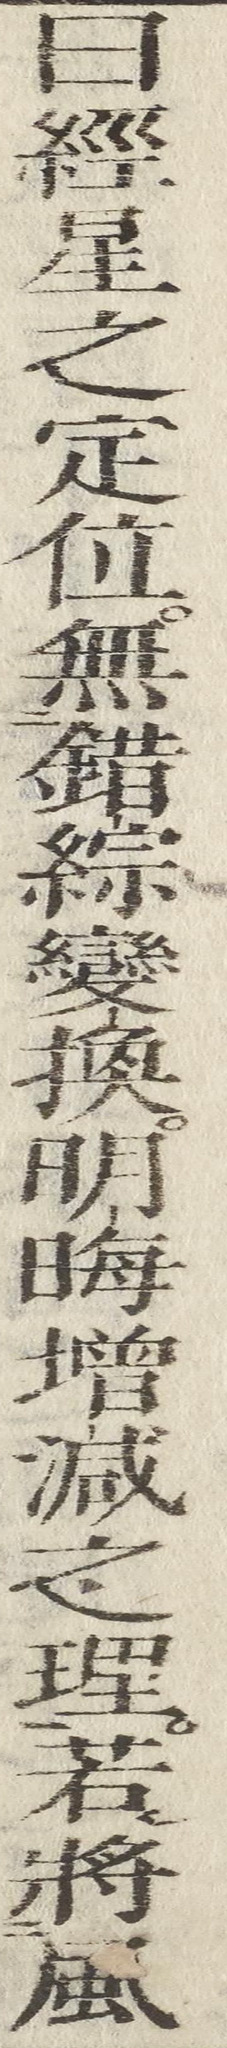曰経星之定位。無錯－綜変－換。明－晦増－減之理。若将風

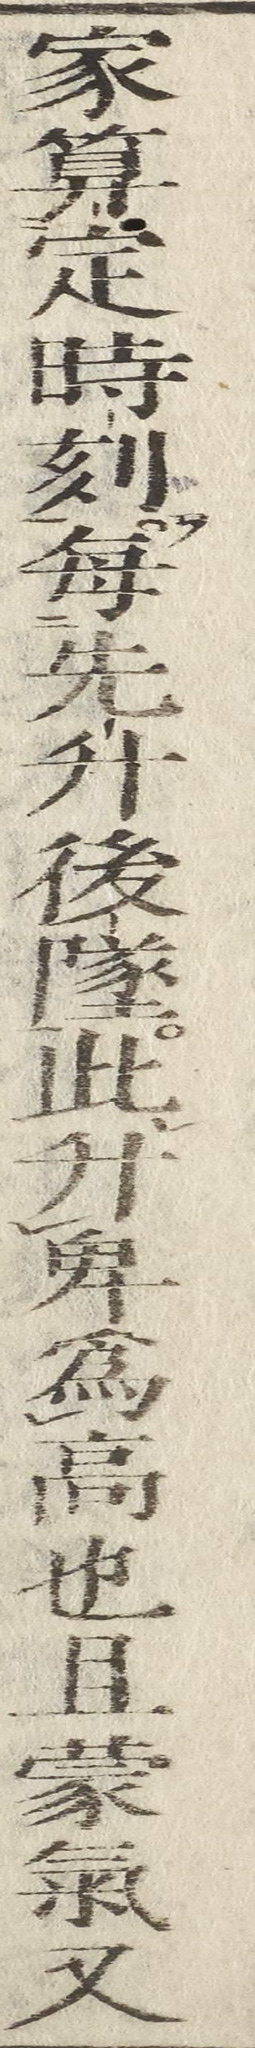家算ー定時－刻毎先－升後－墜。此升卑為高也且蒙気又
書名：天經或問　地
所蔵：東京大学地震研究所図書室 Earthquake Research Institute Library, The University of Tokyo, JAPAN
